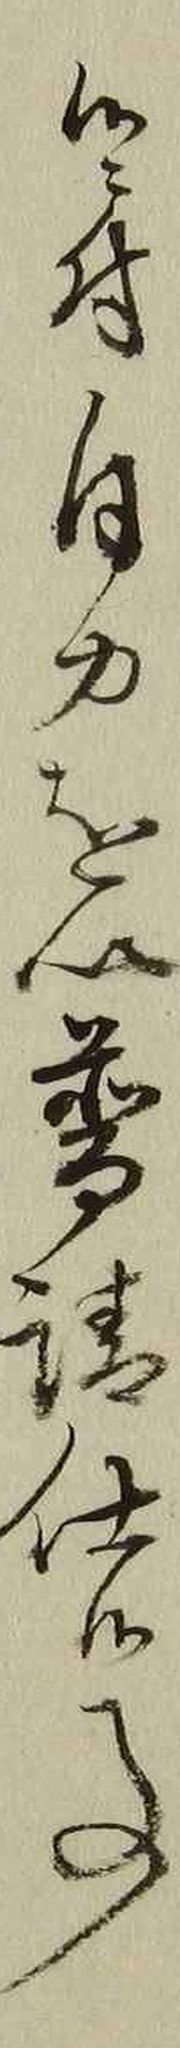候ニ付自力を以普請仕候事
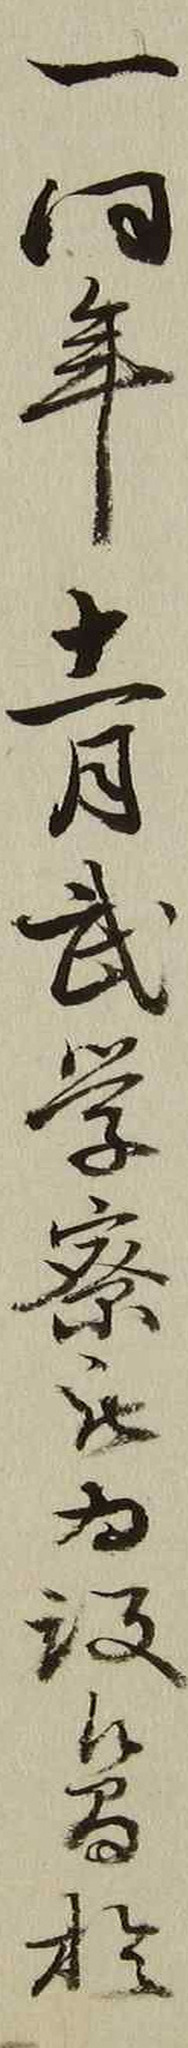一同年十一月武学寮被為設候間於
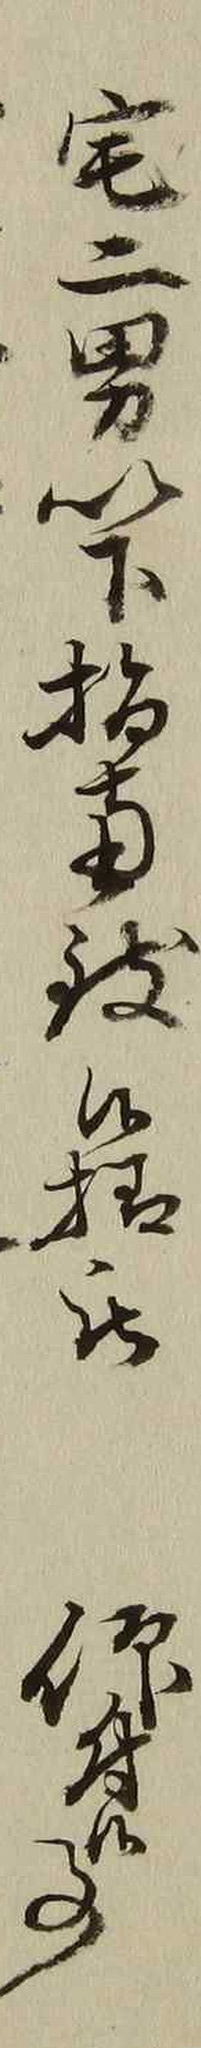宅二男以下指南致候様被仰付候事
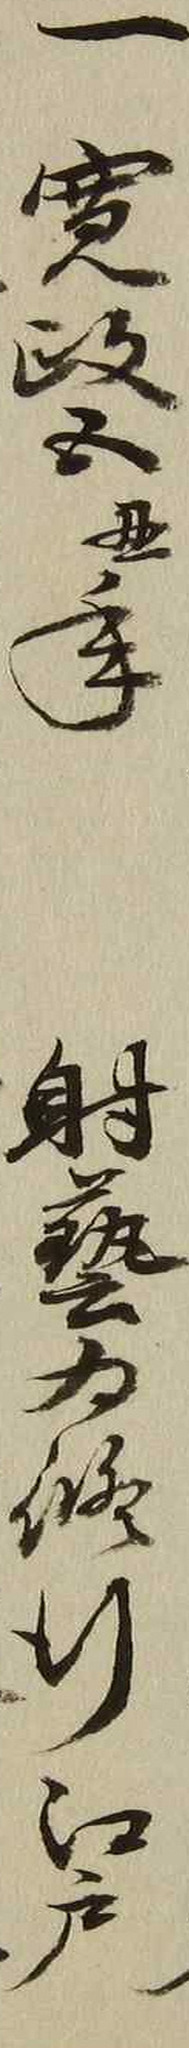一寛政五丑年射芸為修行江戸
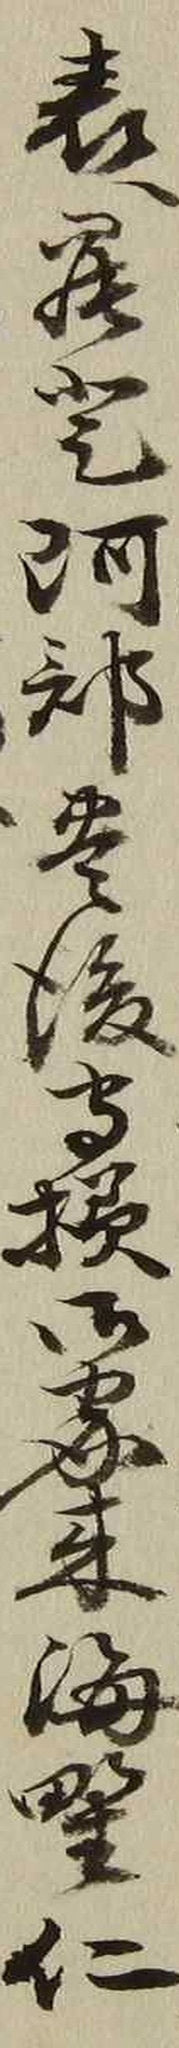表へ罷登阿部豊後守様御家来海野仁
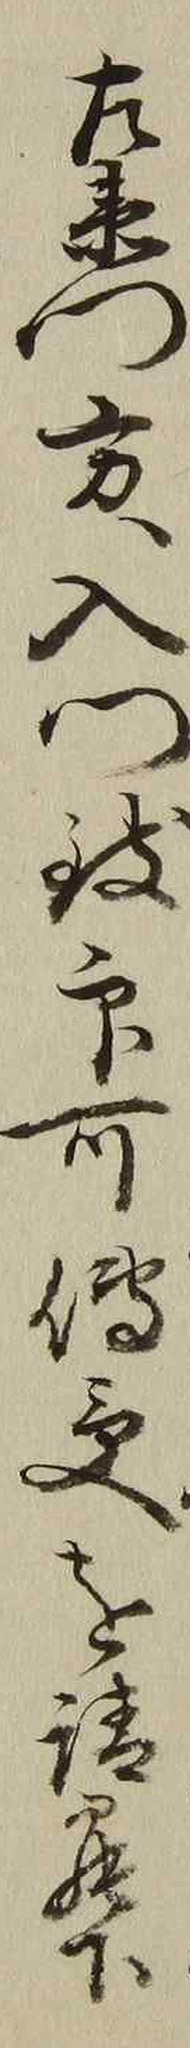左衛門方へ入門致印可伝授を請罷下
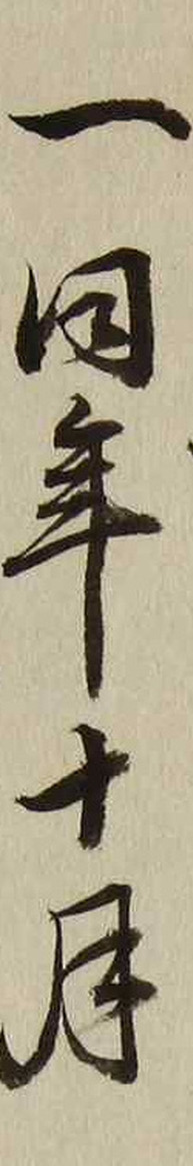一同年十月
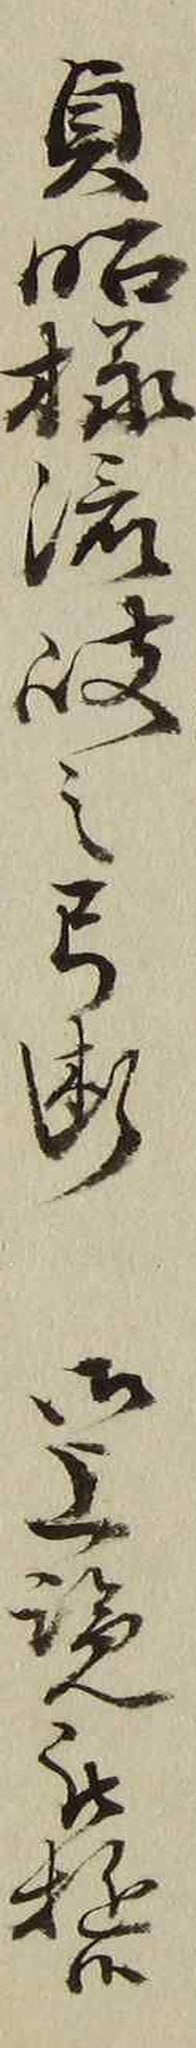貞昭様流岐之弓術御上覧被遊候
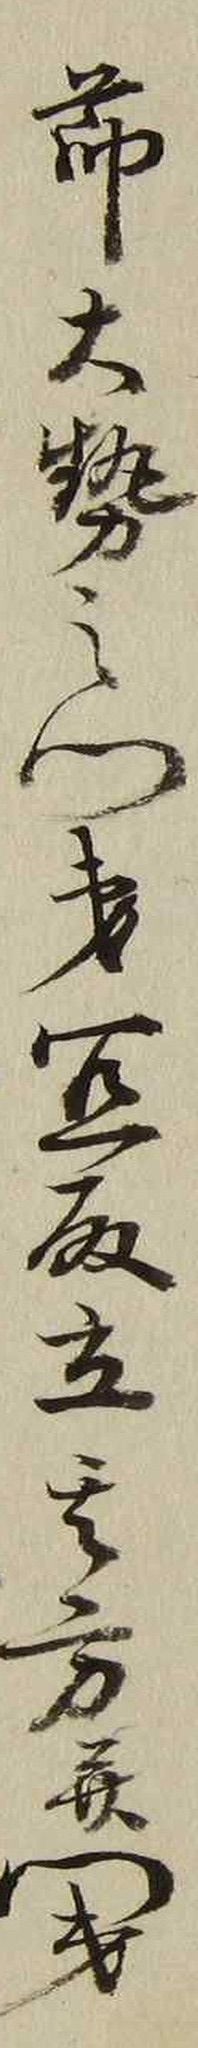節大勢之門弟宜取立其方并門弟
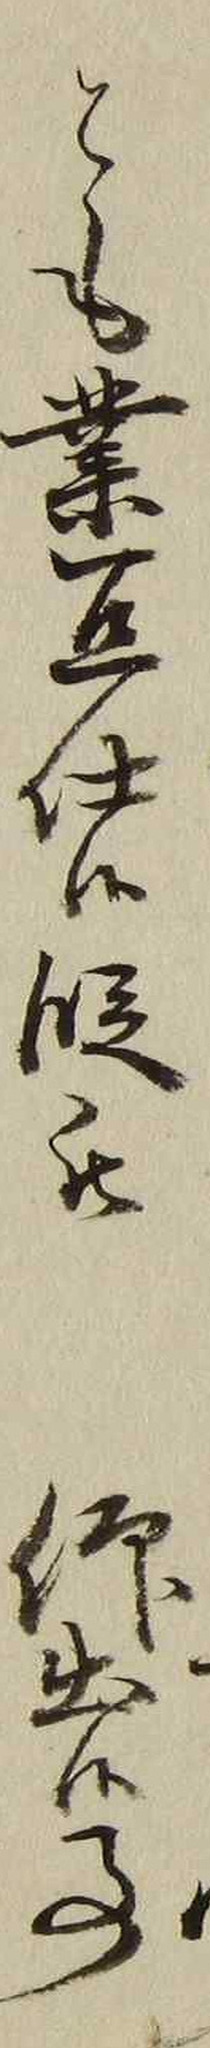とも業宜仕候段被仰出候事
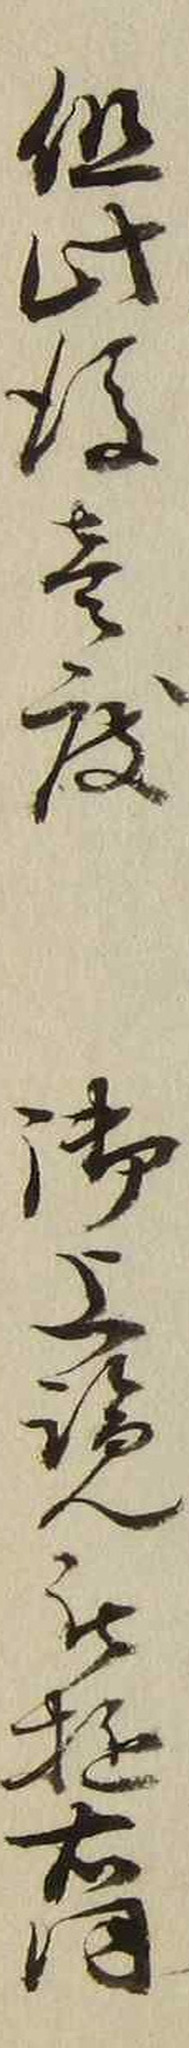但此後壱度御上覧被遊右同

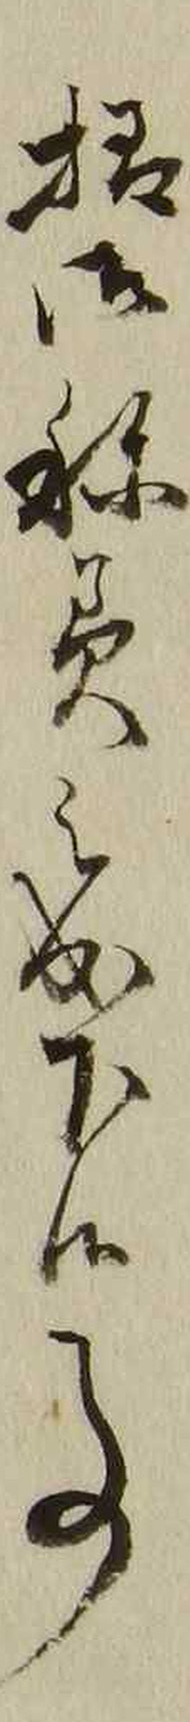様御称美被成下候事
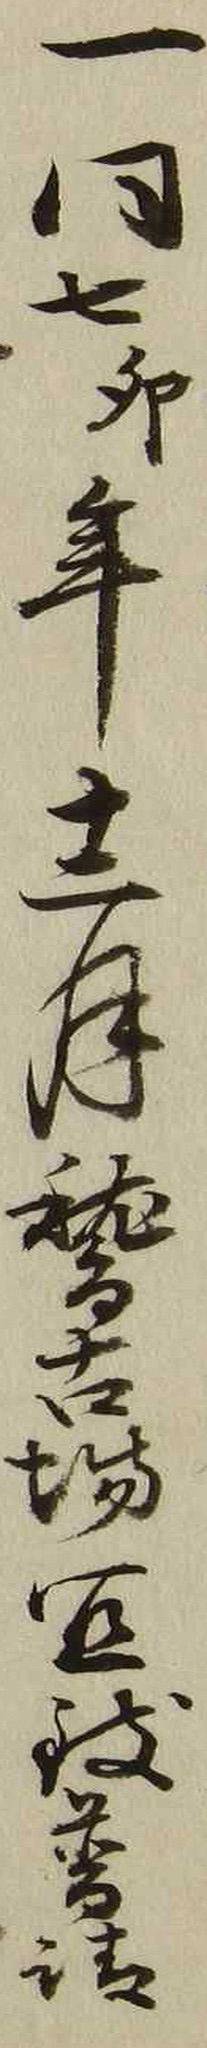一同七卯年十ニ月稽古場宜致普請
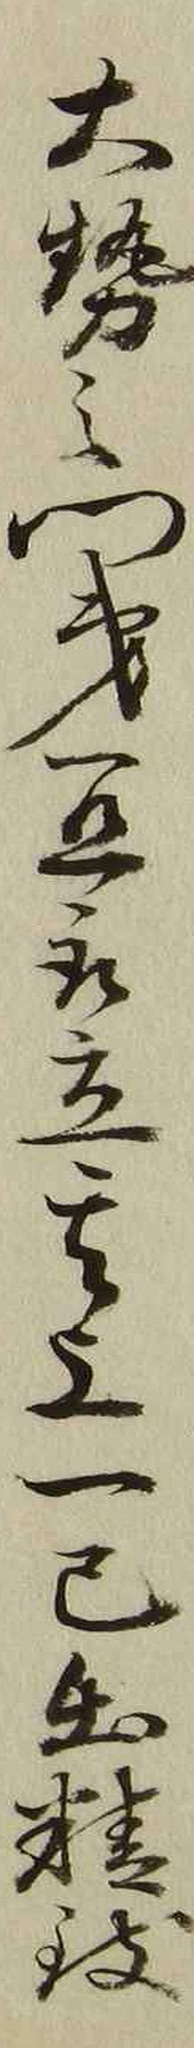大勢之門弟宜取立其上一己出精致
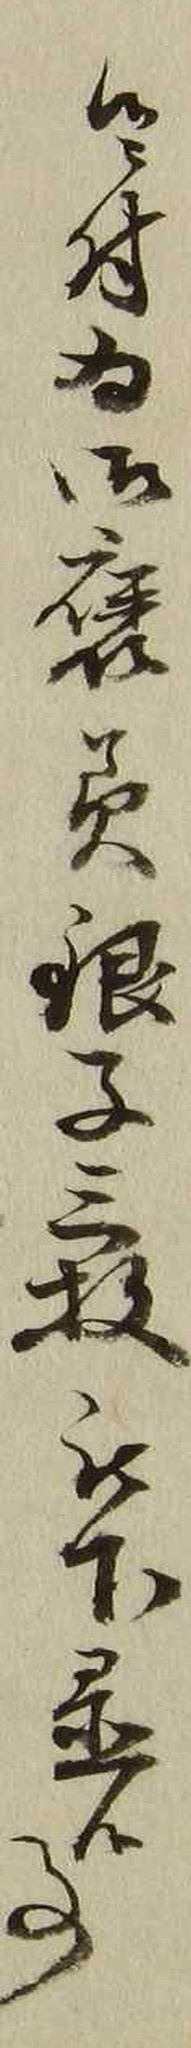候ニ付為御褒美銀子三枚被下置候事
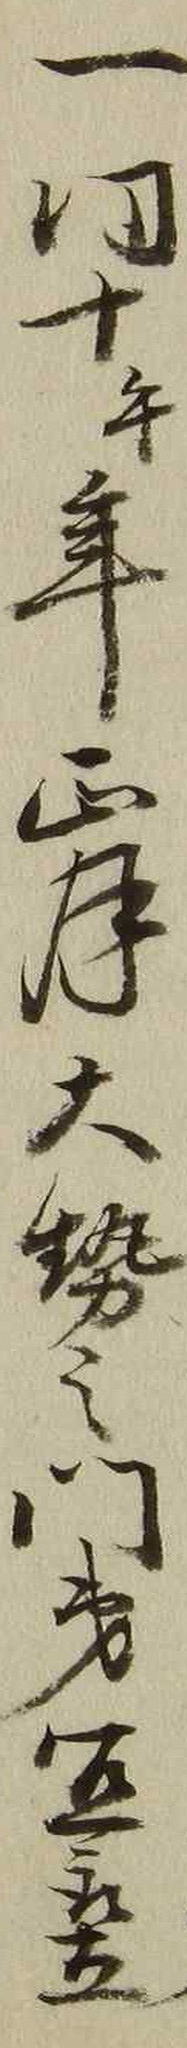一同十午年正月大勢之門弟宜取立
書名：諸士系譜　巻之36　は之部4
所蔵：会津若松市立会津図書館
